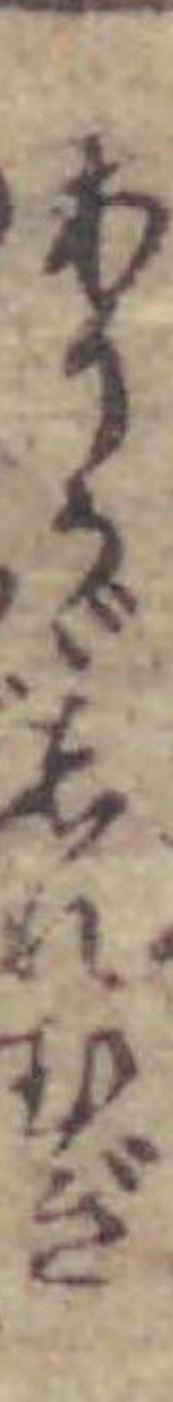ありかゞしれむぎ
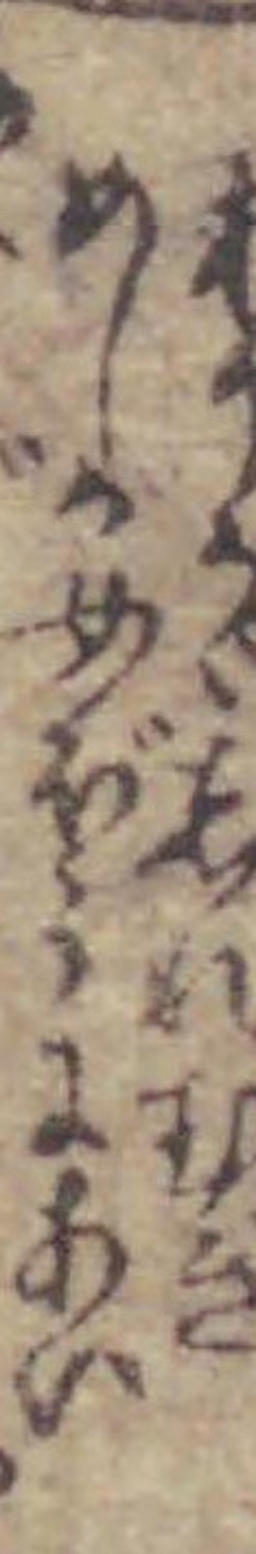めしか女ぼうにあい
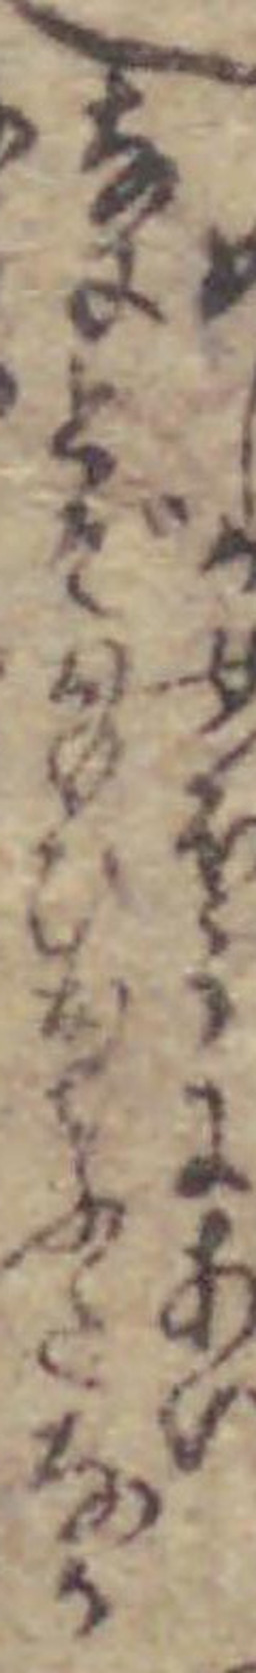なにとぞおもひおもふたなか
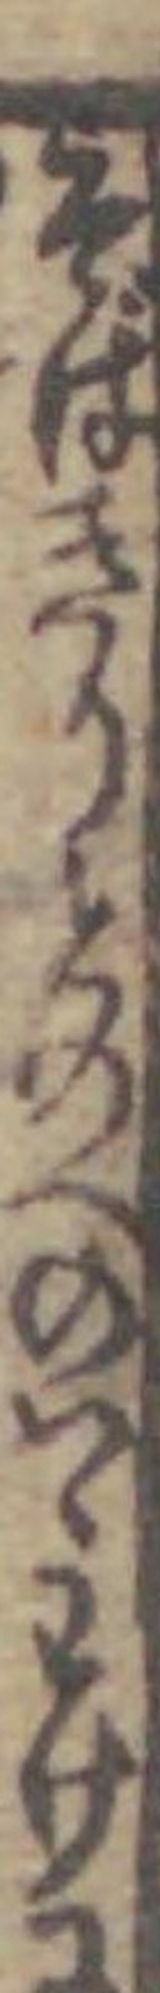そばきりとのへのいゝわけに
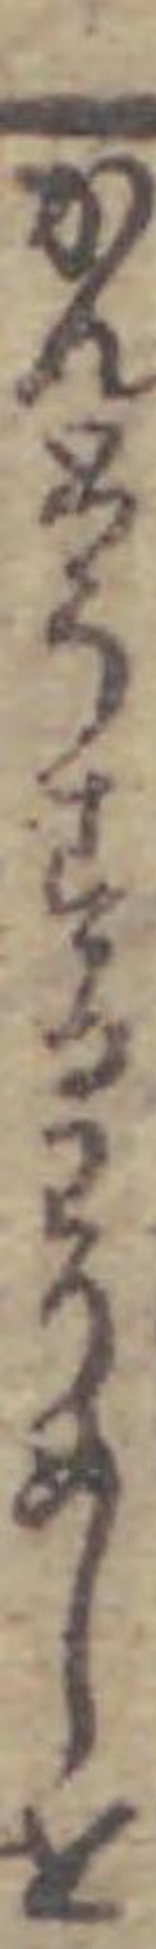かんとうするわりめしを
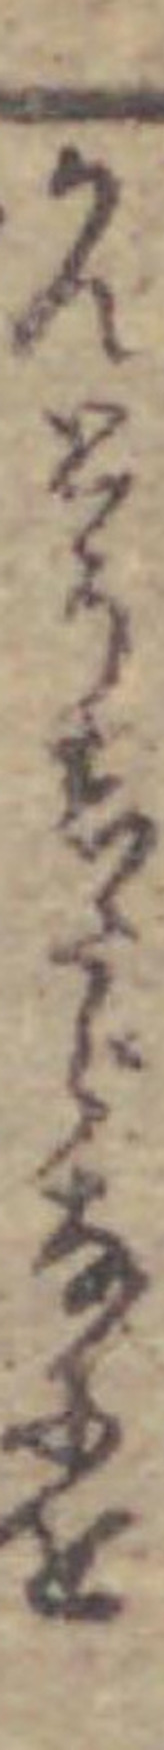かんとうしたらなにを
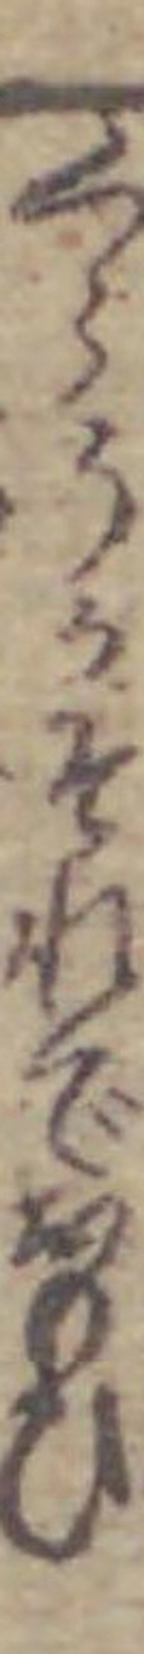くらうかそれでおもひ
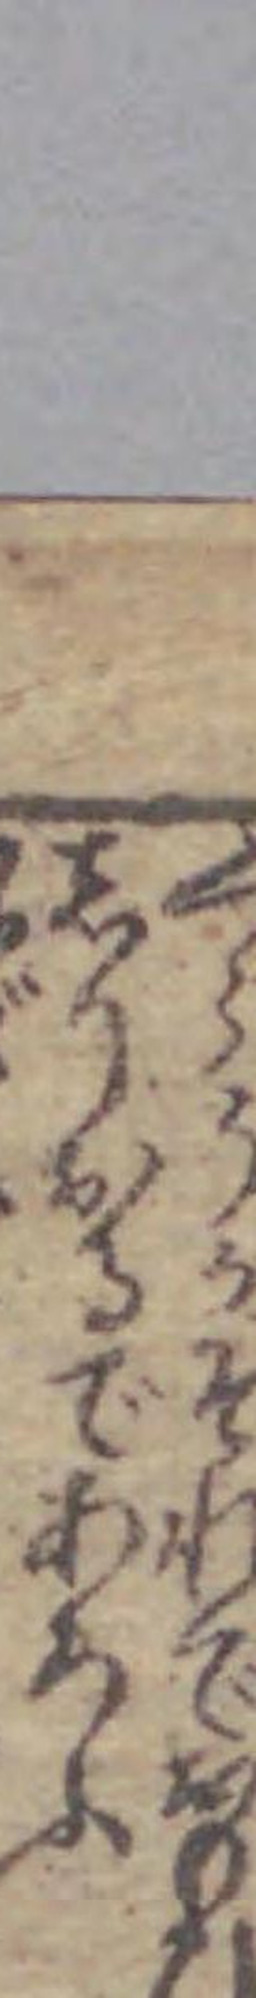しりおるであろふ
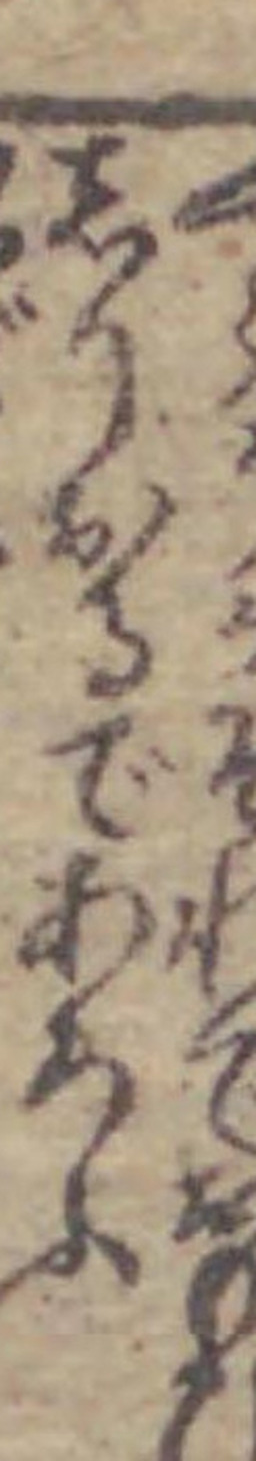しりおるであろふ
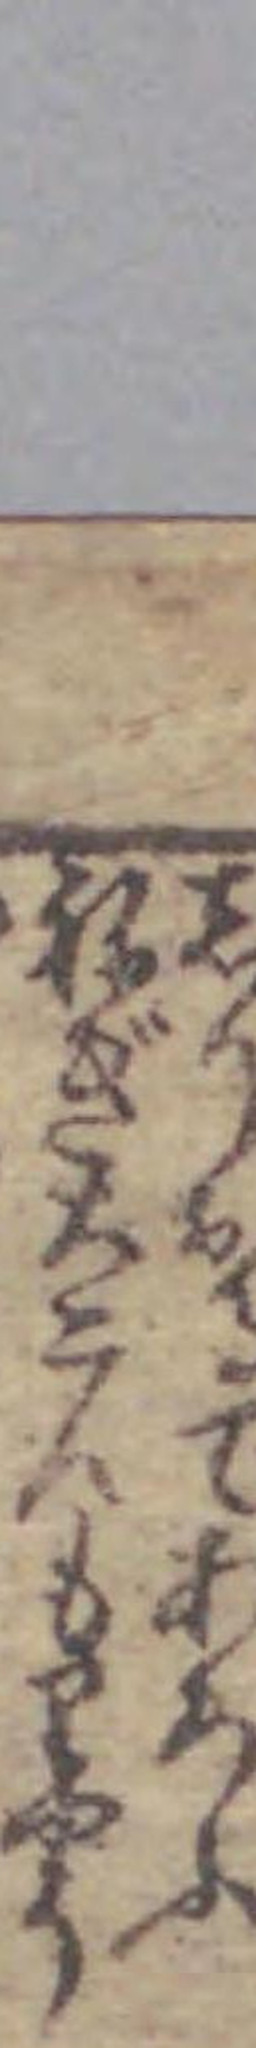ねぎ大こんもりやう
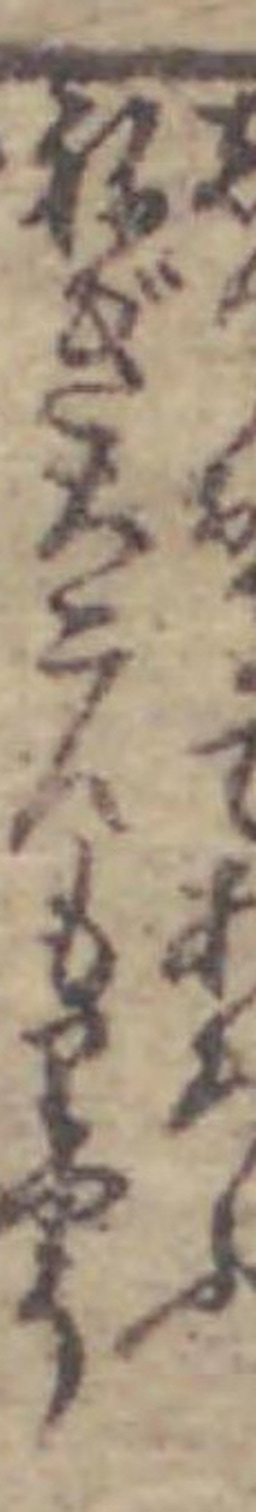ねぎ大こんもりやう
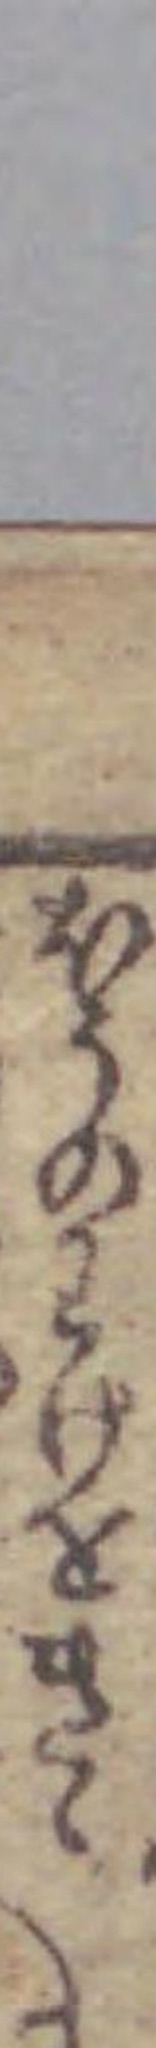ほうのわけをきゝ
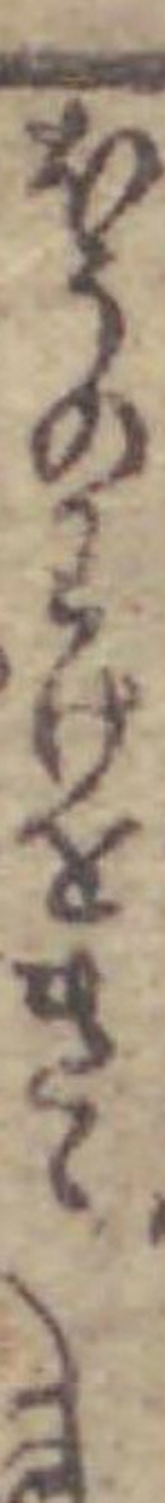ほうのわけをきゝ
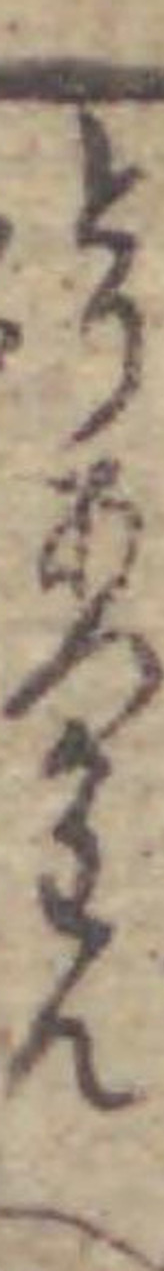とりあつかわん
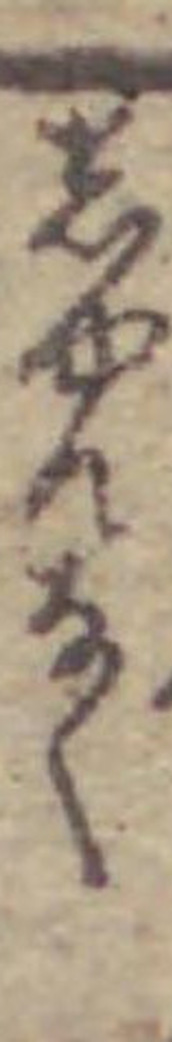しやんなく
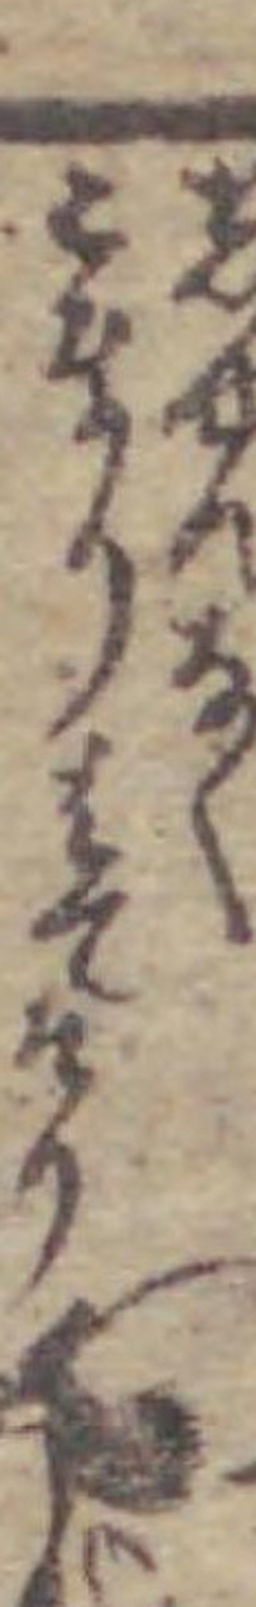こまりはてけり
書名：諸事米の飯 : 3巻
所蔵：国立国会図書館 National Diet Library, JAPAN
